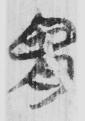胃
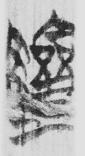險
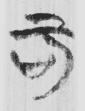可
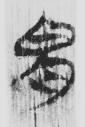胃
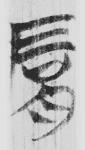{厂肙}
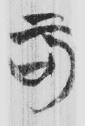可
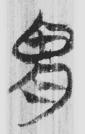胃
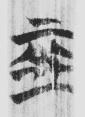亞
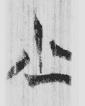少
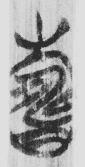壽
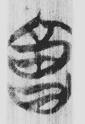會[合]
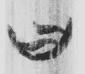曰
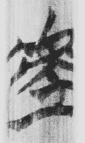𫊟
